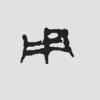用
